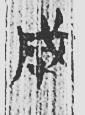成
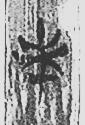未
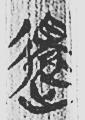還
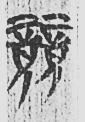競
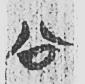公
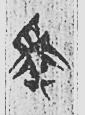卒B
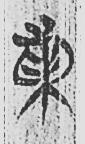{木𦥑}
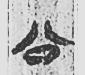公
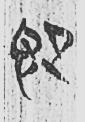即
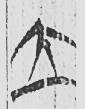立
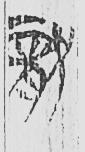{𦚏兄}
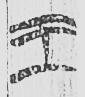王
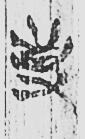史
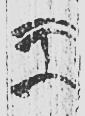王
